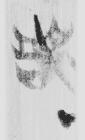若
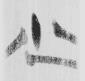少
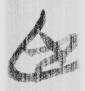臣
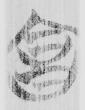合
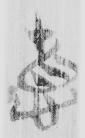惪
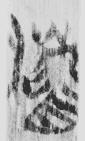濬
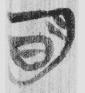明
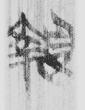執
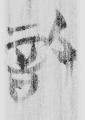信
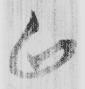㠯（以）
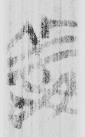義
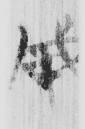成
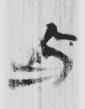此
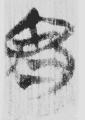胃
